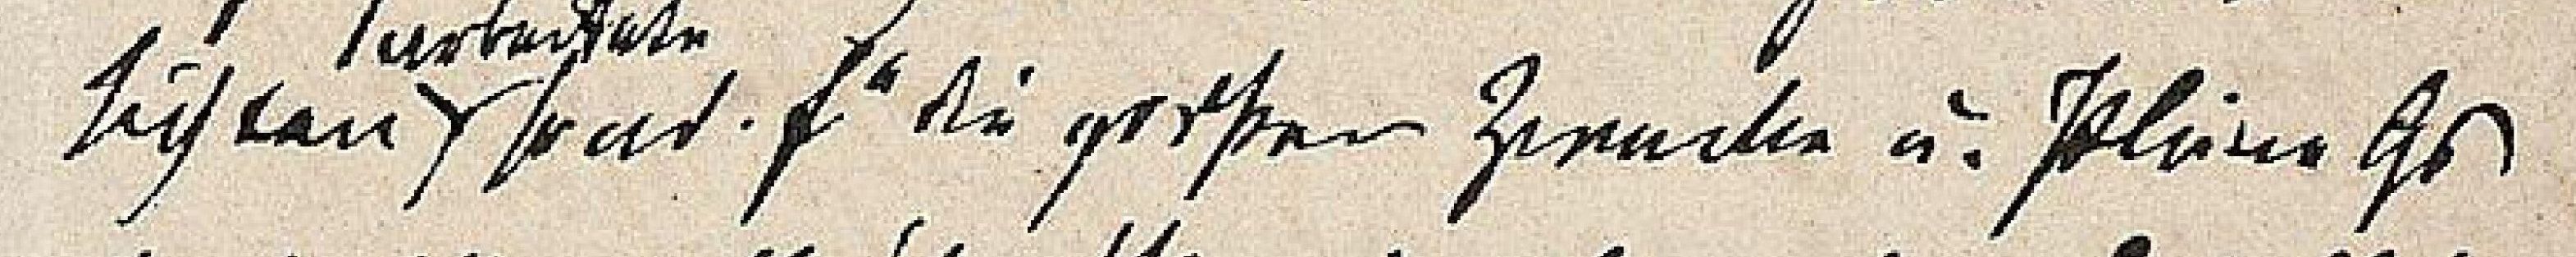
sichten, sond. fü die größten Zwecke u. Pläne Gs
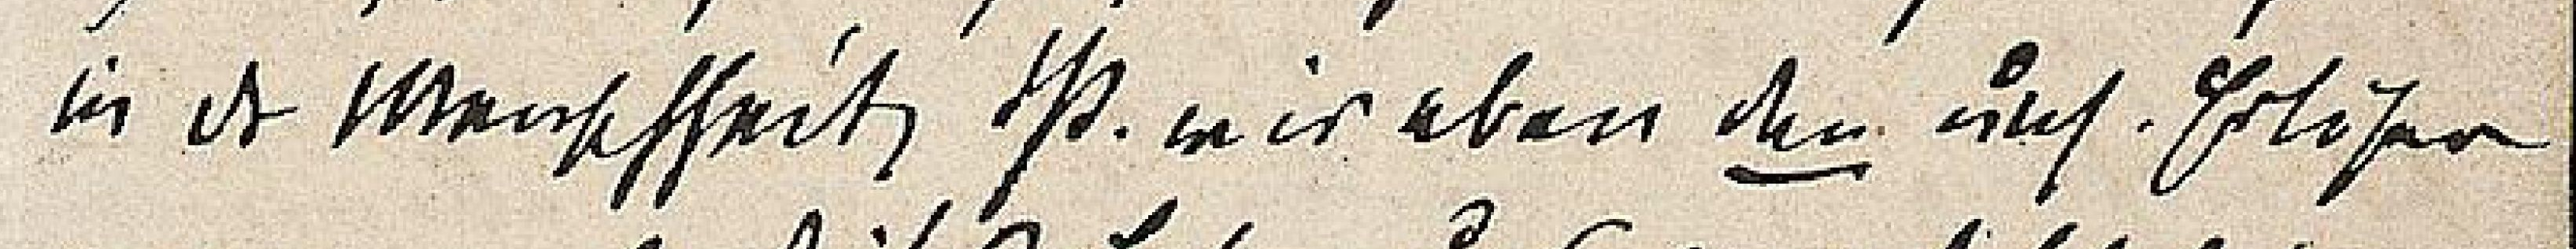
in dr Menschheit, daß. wir eben den uns Erlöser
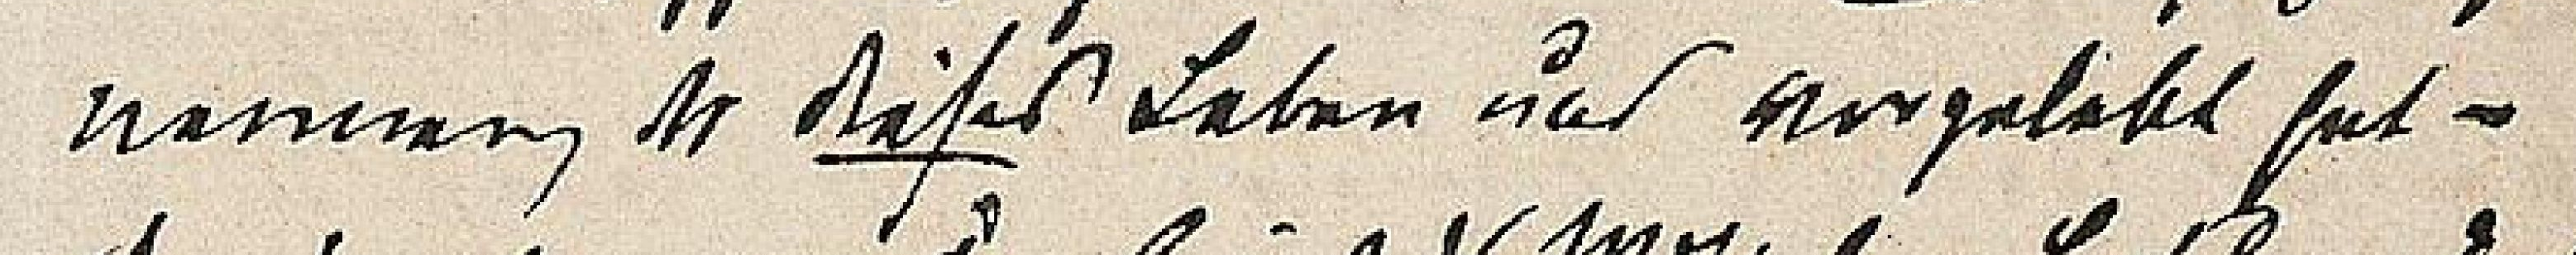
nennen, dr dieses Leben uns vorgelebt hat. _
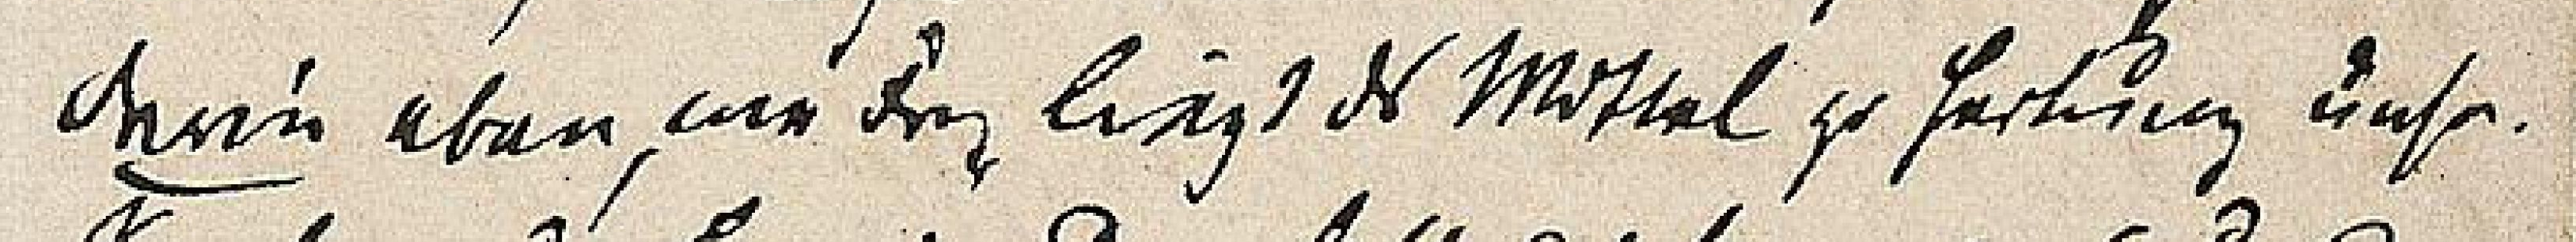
darin eben, mn Fr., liegt ds Mittel zu Heilung unsre
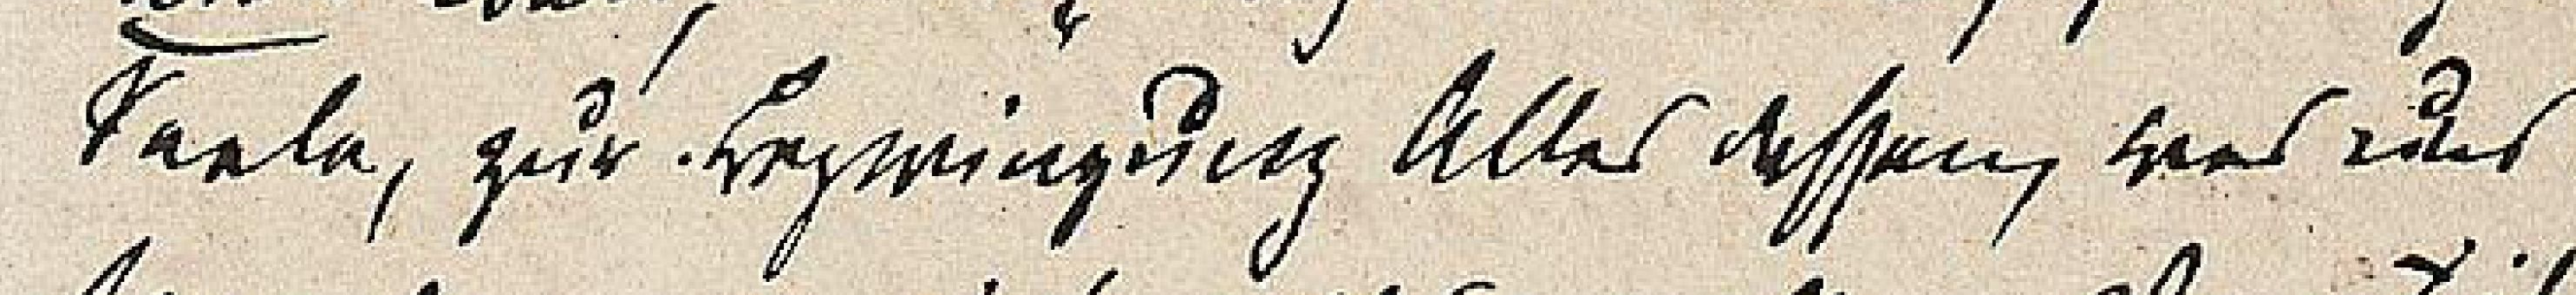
Seele, zur Bezwingung Alles dessen, was uns
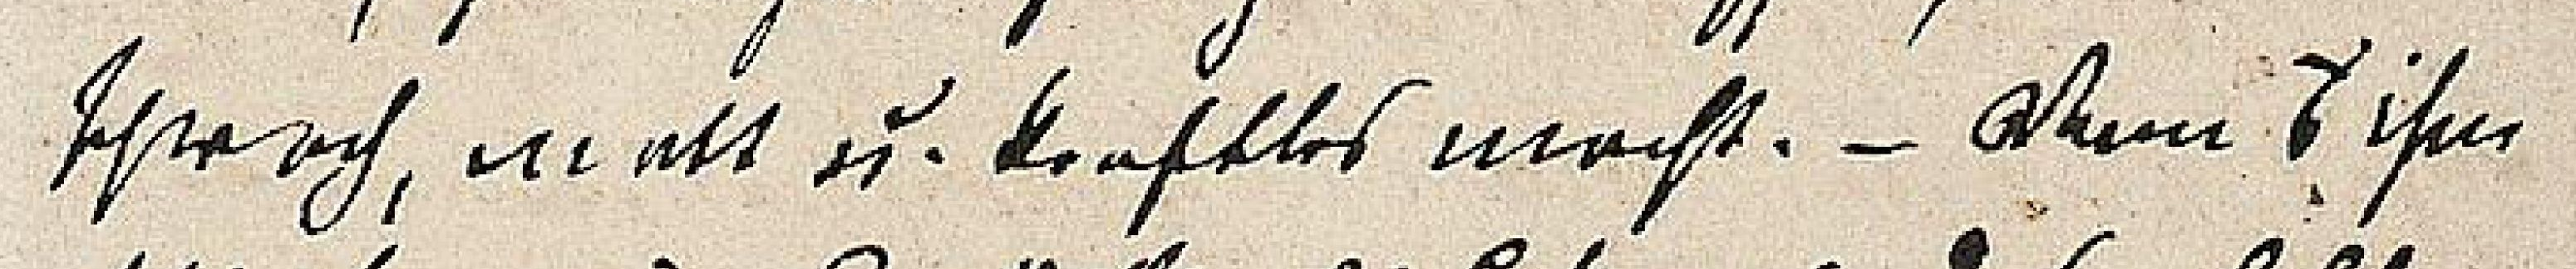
schwach, matt u. kraftlos macht. _ Den s ihm
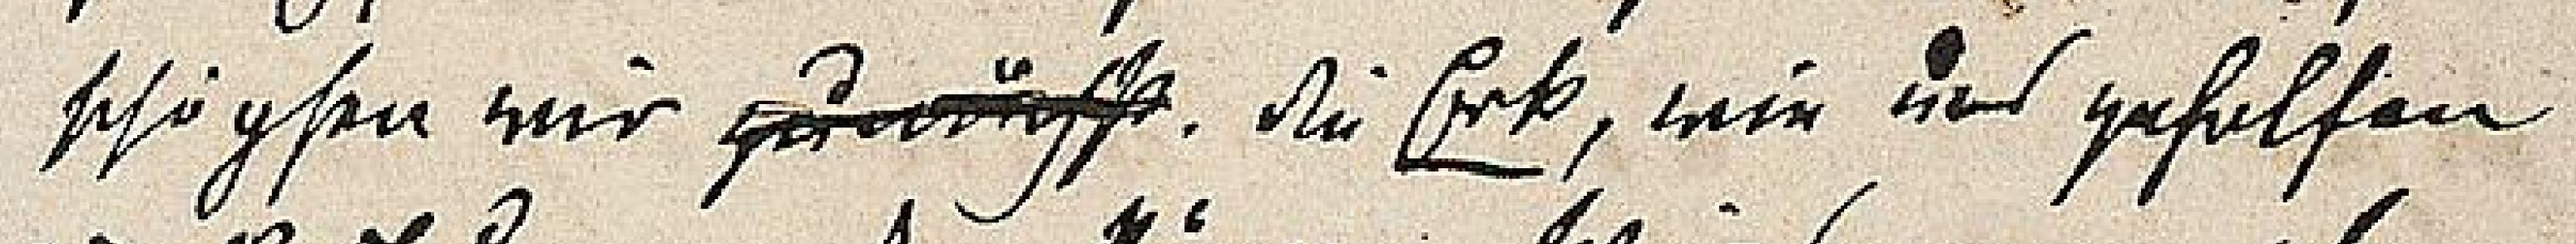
schöpfen wir zunächst die Erk., wie uns geholfen
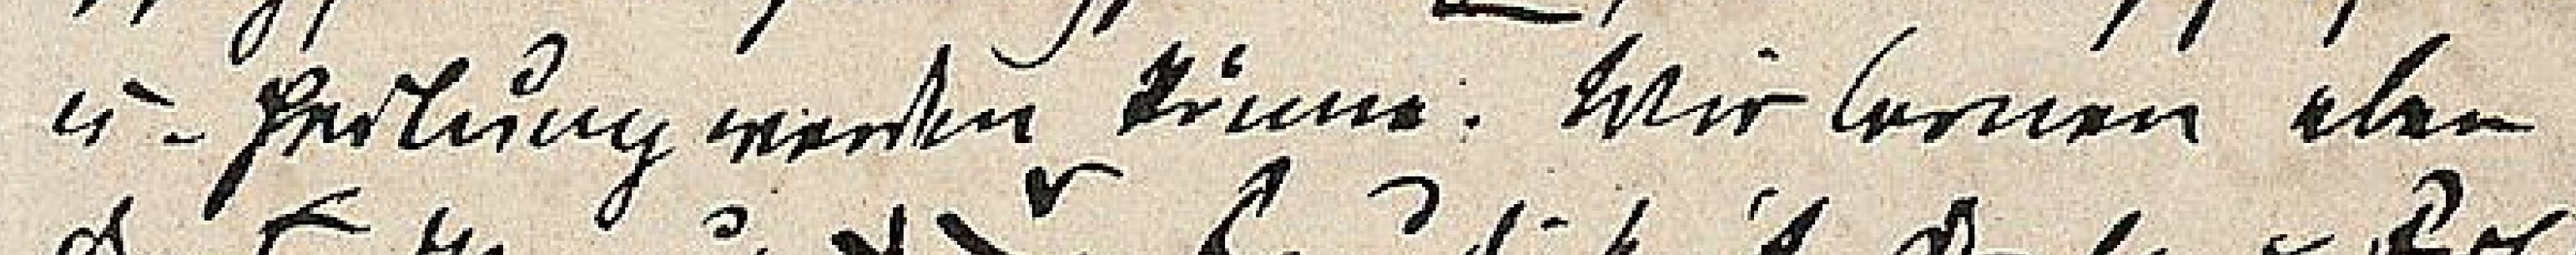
u. Heilung werden könne. Wir lernen eben
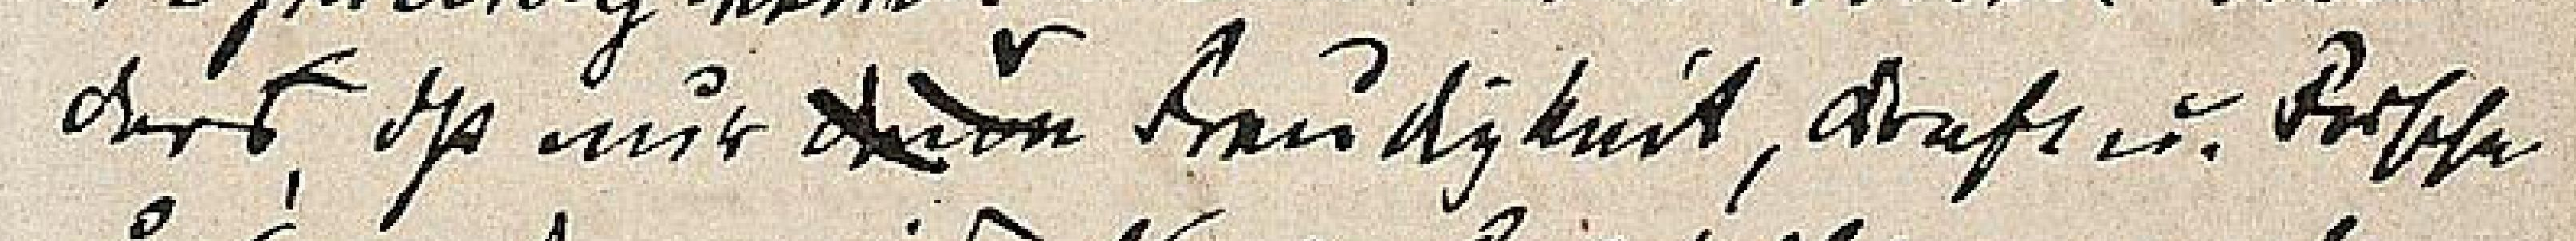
ders, daß nur dann Freudigkeit, Kraft u. Frische
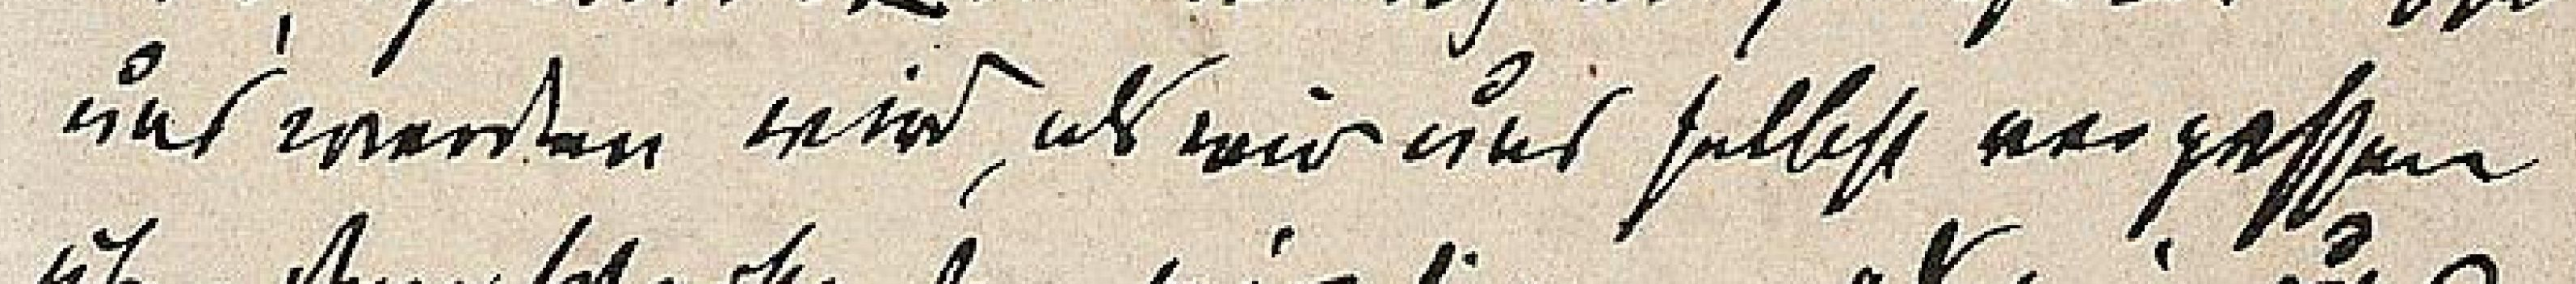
uns werden wird, als wir uns selbst vergessen
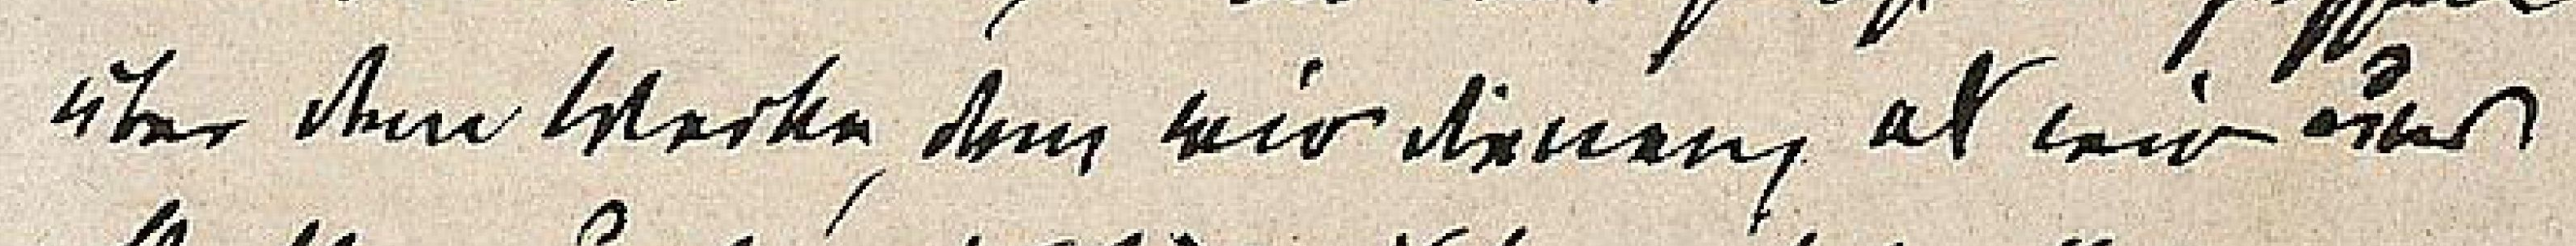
über den Werke, dem wir denen, es wir uns
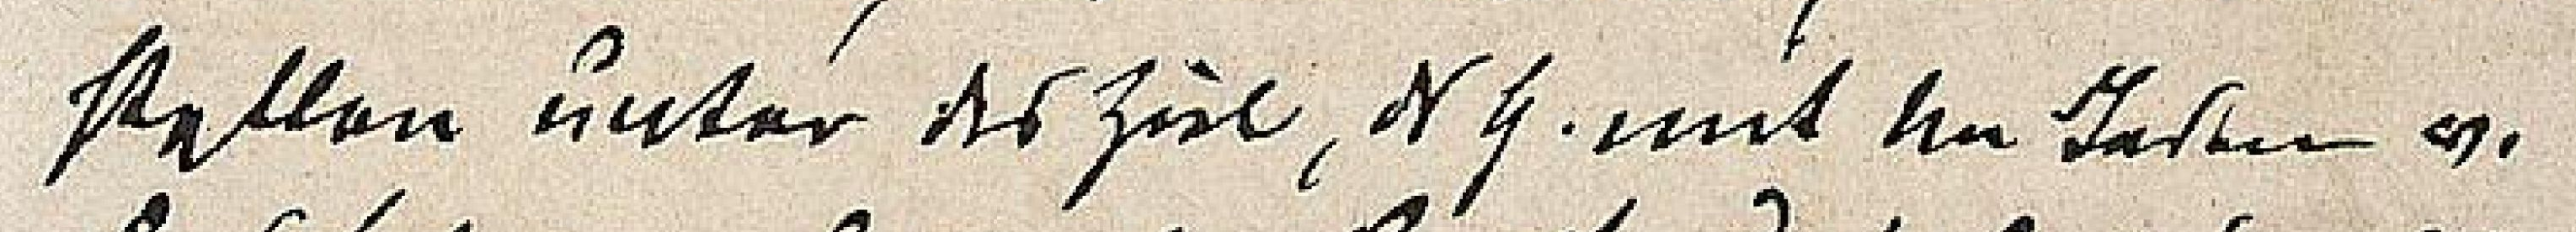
stellen unter das Ziel, ds G mit 1m Jeden v.
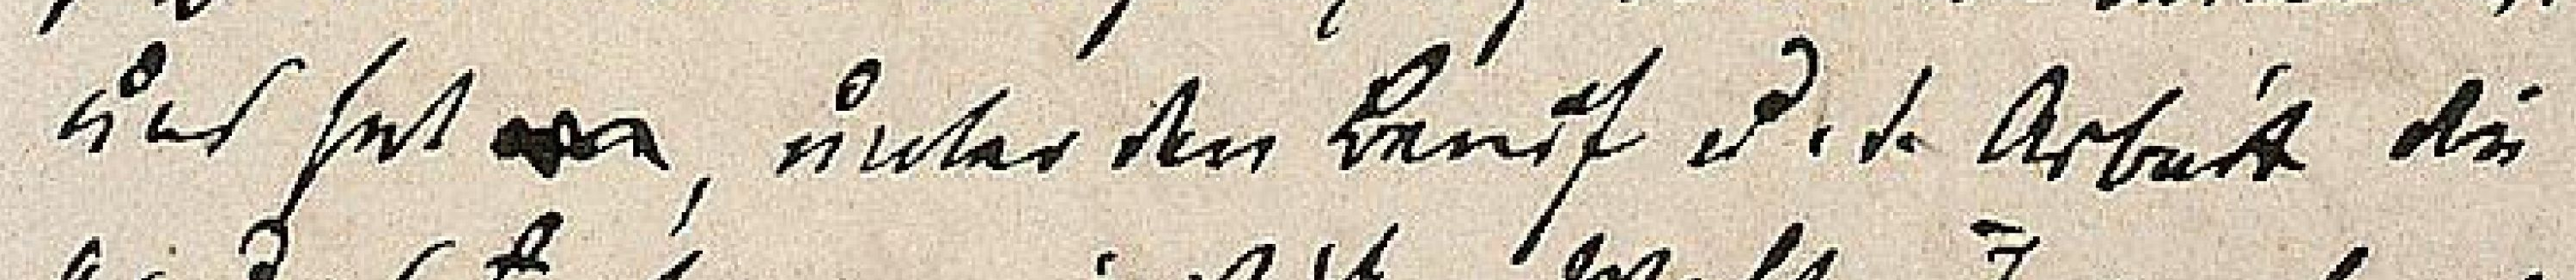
uns hat u. unter den Beruf u. d. Arbeit die
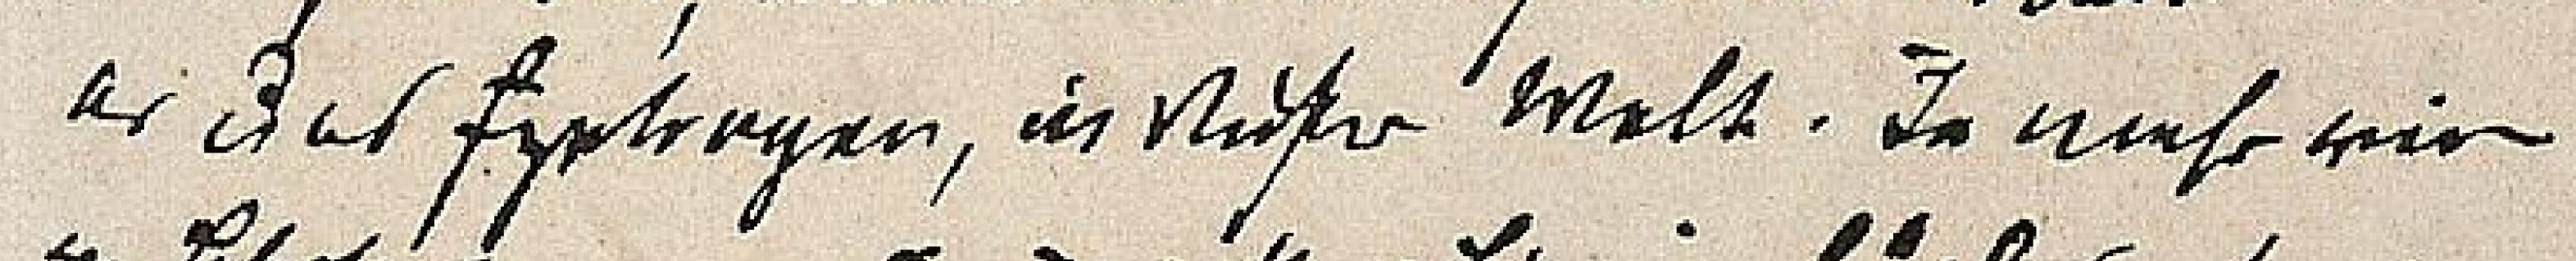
er uns fgetragen, in dieser Welt. Je mehr wir
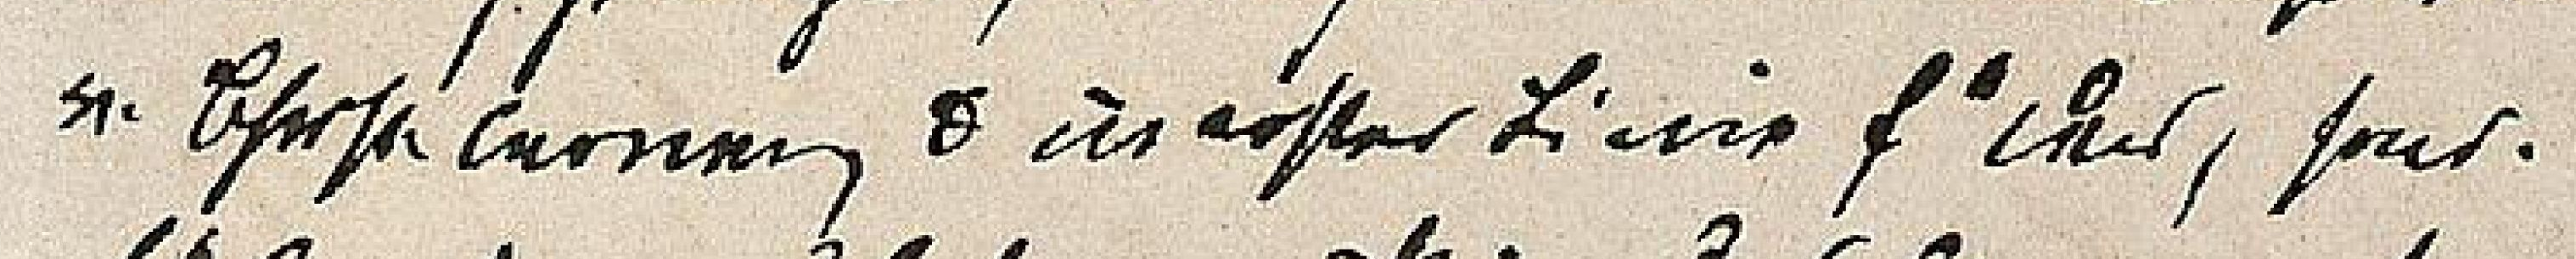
v. Christ. lernen, o in erster Linie fü uns, sond.
